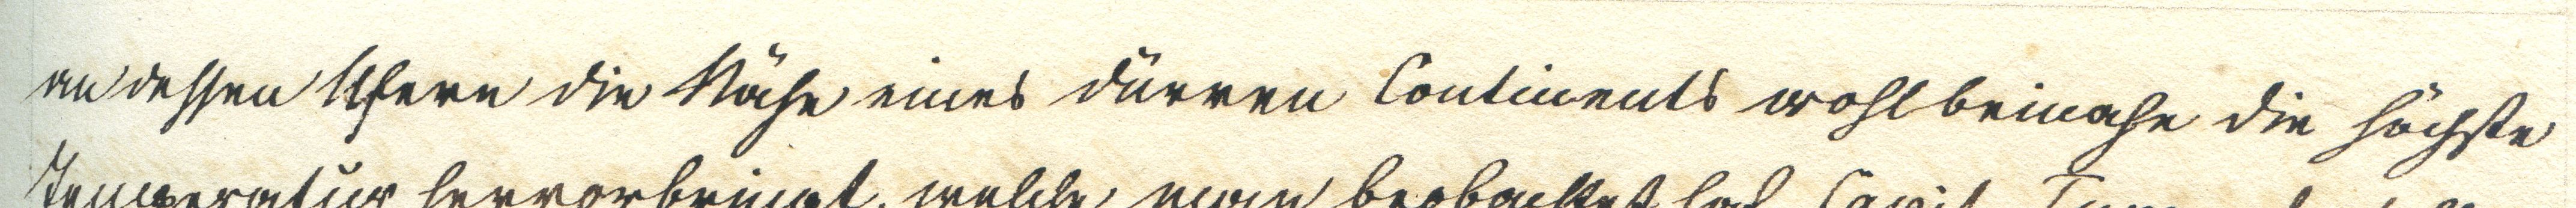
an dessen Ufern die Nähe eines dürren Continents wohlbeinahe die höchste
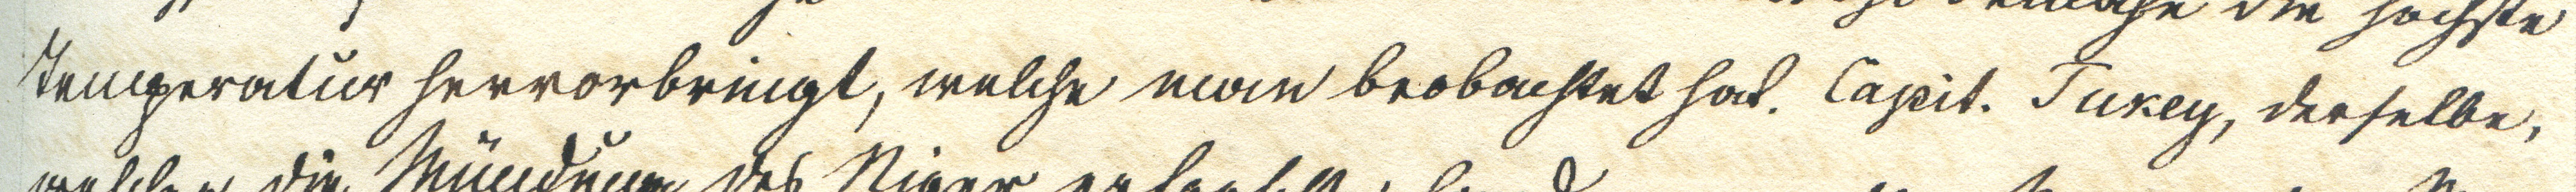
Temperatur hervorbringt, welche man beobachtet hat. Capit. Tukey, derselbe
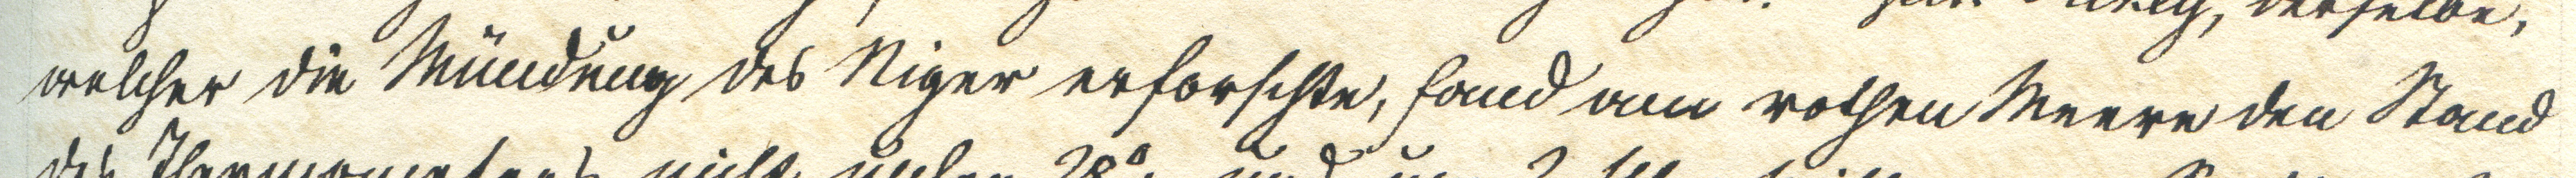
welcher die Mündung des Niger erforschte, fand am rothen Meere den Stand
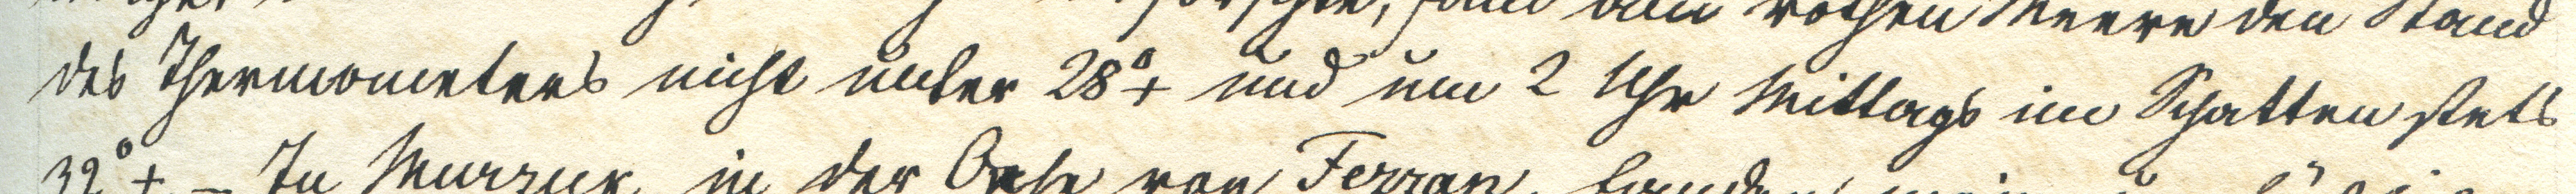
des Thermometers nicht unter 28°+ und um 2 Uhr Mittags im Schatten stets
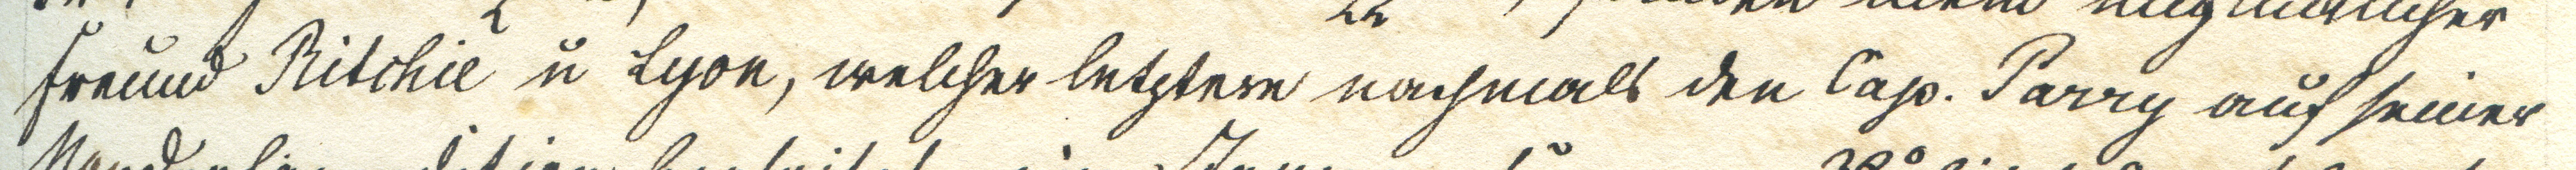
Freund Ritchie u Lyon, welcher letztere mehrmals den Cap. Parry auf seiner
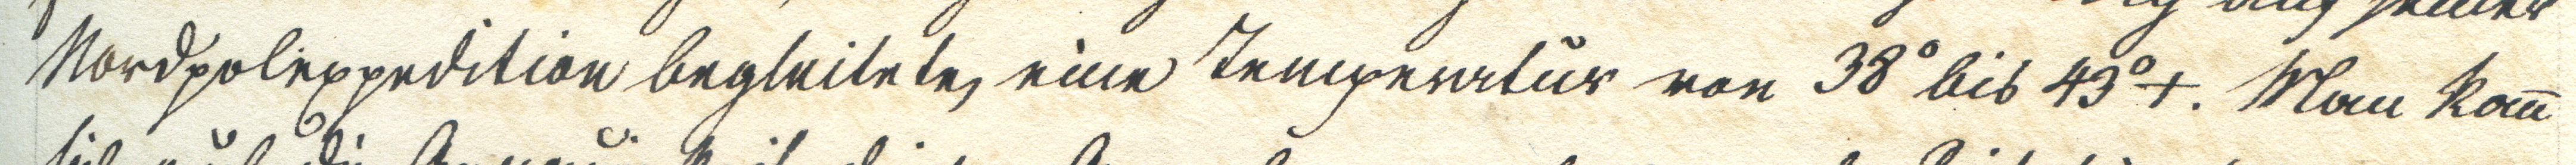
Nordpolexpedition begleitete, eine Temperatur von 38° bis 43°+. Man kañ
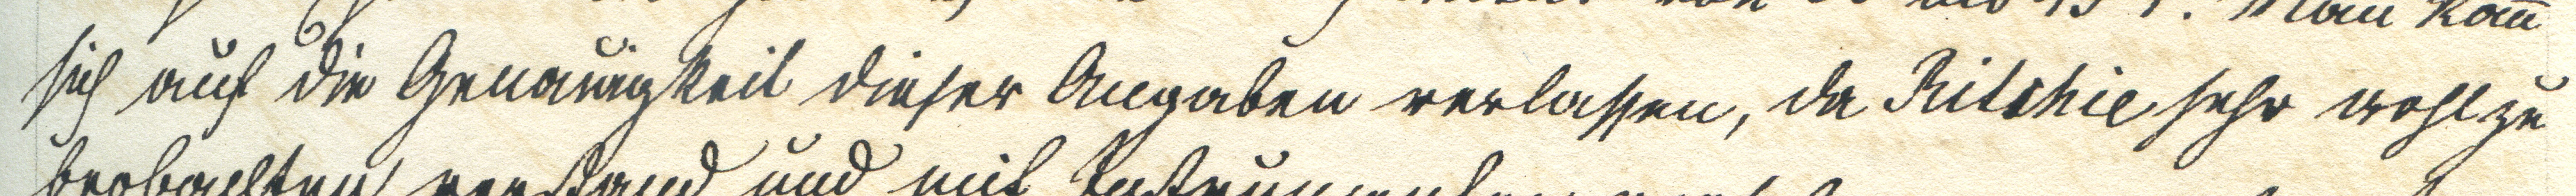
sich auf die Genauigkeit dieser Angaben verlassen, da Ritchie sehr wohl zu
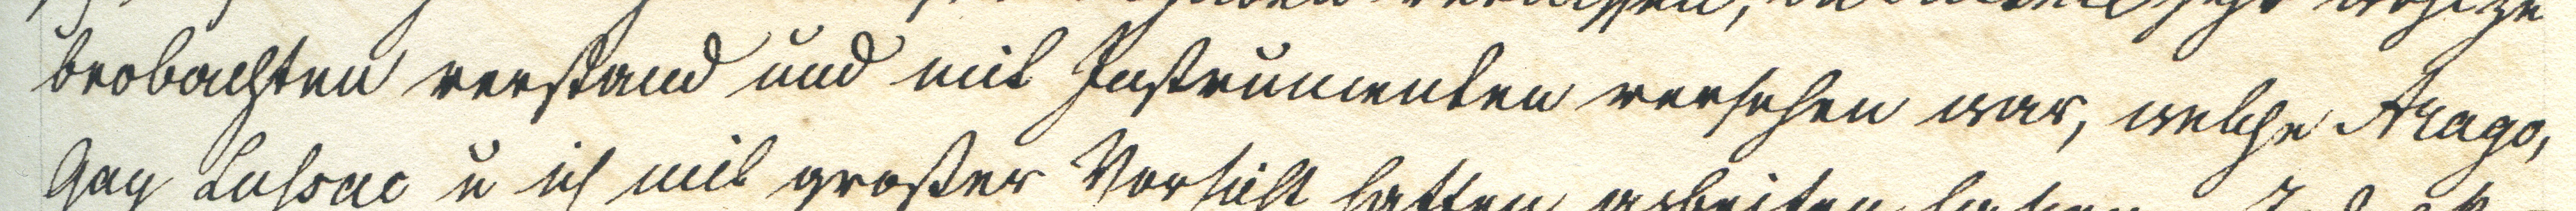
beobachten verstand und mit Instrumenten versehen war, welche Arago,
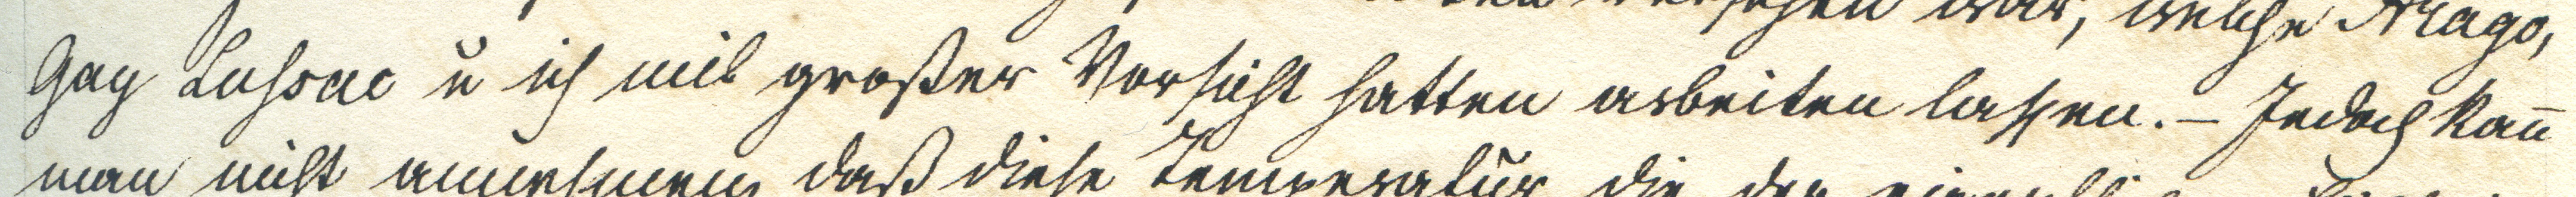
Gay Lussac u ich mit großer Vorsicht hatten arbeiten lassen. Jedoch kañ
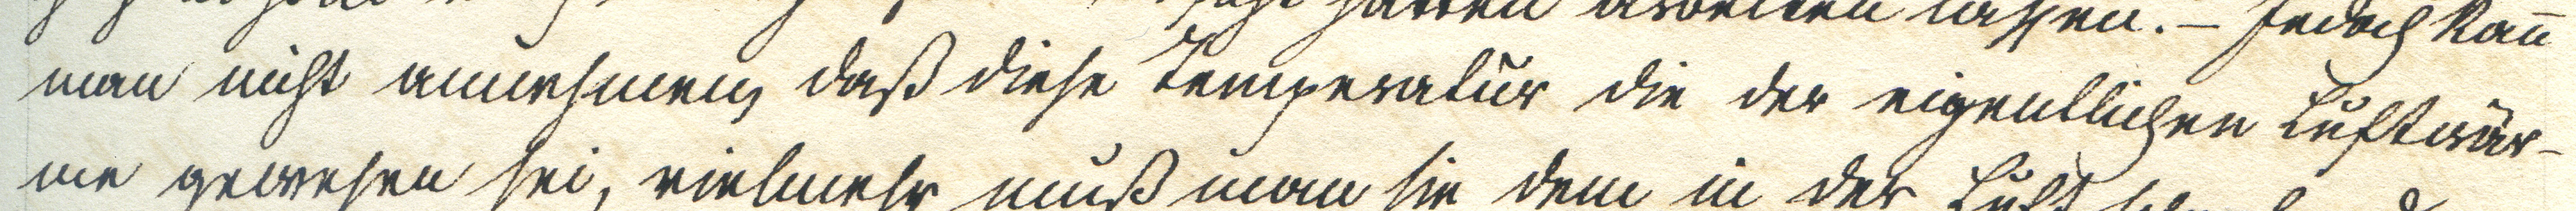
man nicht annehmen, daß diese Temperatur die der eigentlichen Luftwär-
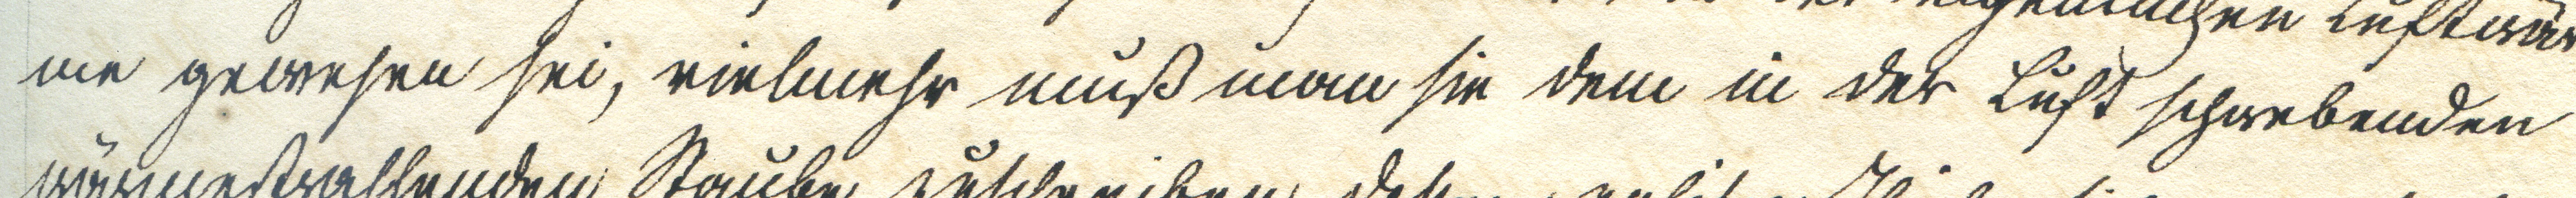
me gewesen sei, vielmehr muß man sie dem in der Luft schwebenden
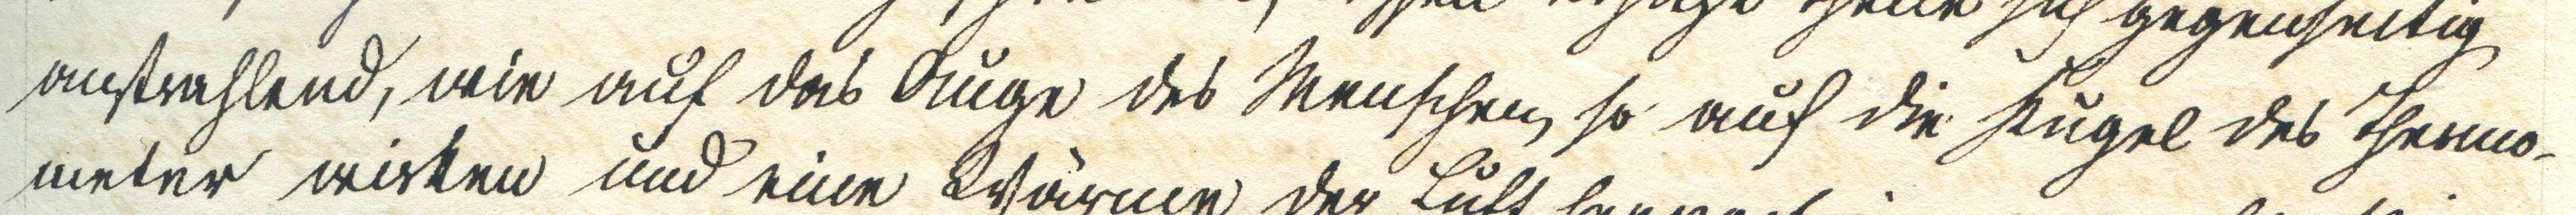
anstrahlend, wie auf das Auge des Menschen, so auch auf die Kugel des Thermo-
